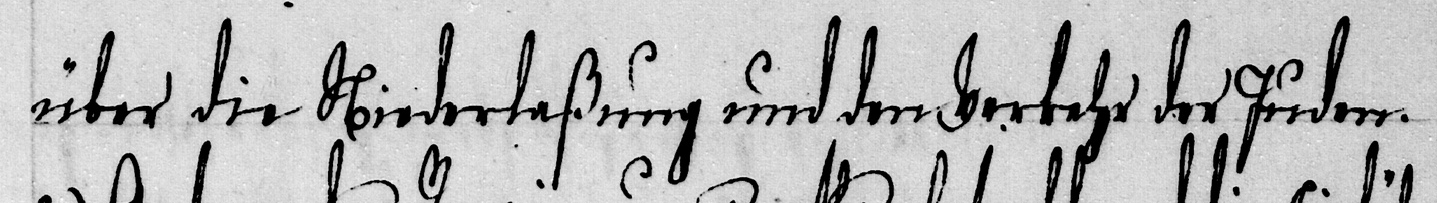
über die Niederlaßung und den Verkehr der Juden.
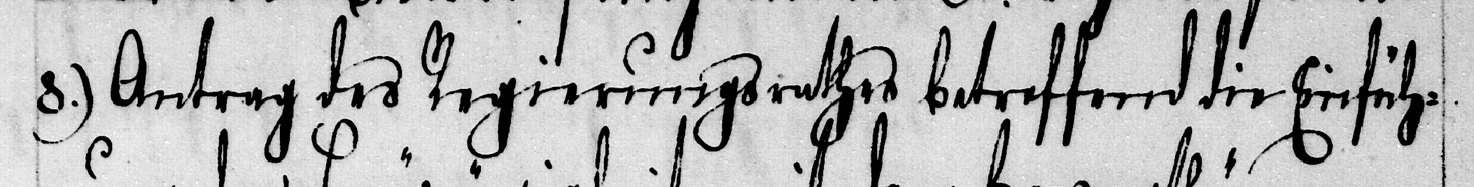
8.) Antrag des Regierungsrathes betreffend die Einfüh¬
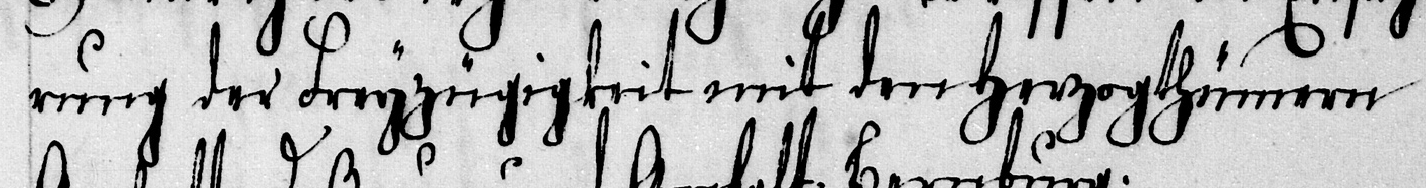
rung der Freyzügigkeit mit den Herzogthümern
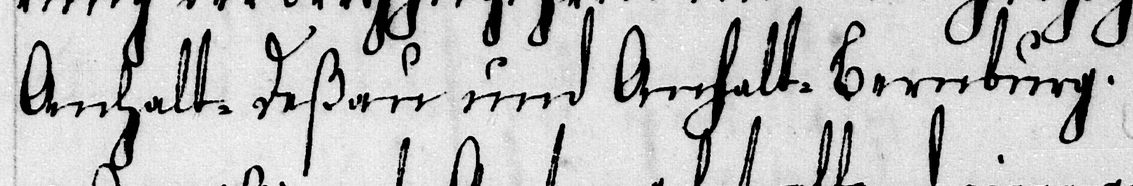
Anhalt-Deßau und Anhalt-Bernburg.
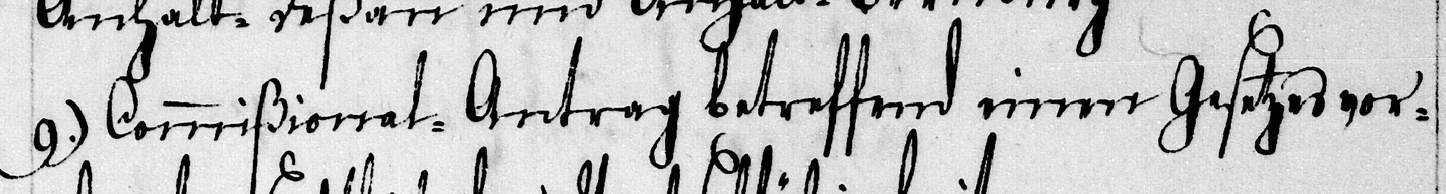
9.) Commißional-Antrag betreffend einen Gesetzesvors¬
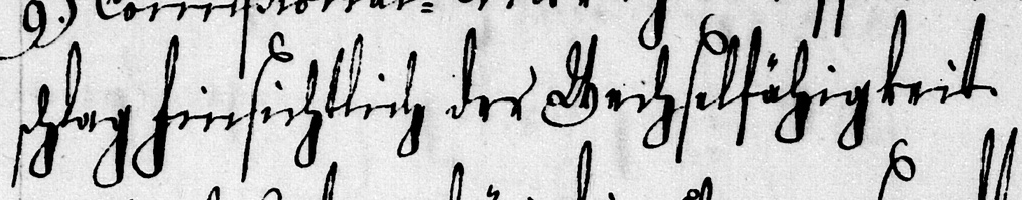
hlag hinsichtlich der Wechselfähigkeit.
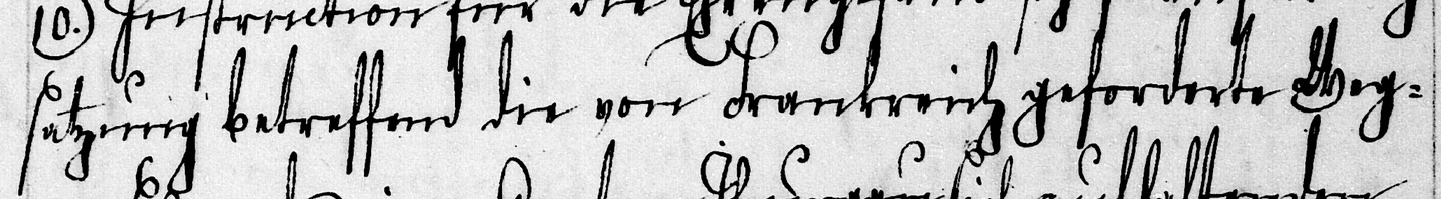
satzung betreffend die von Frankreich geforderte Weg¬
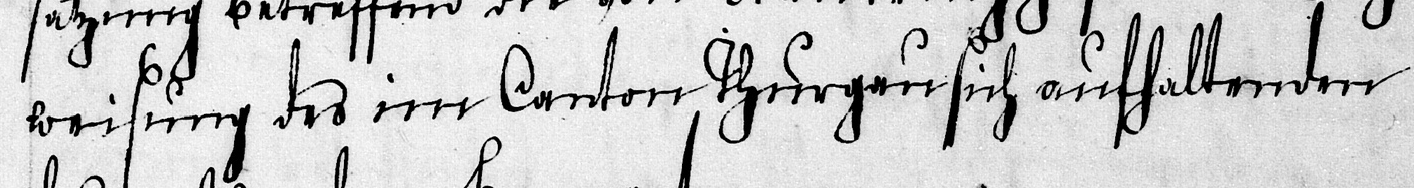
weisung des im Canton Thurgau sich aufhaltenden
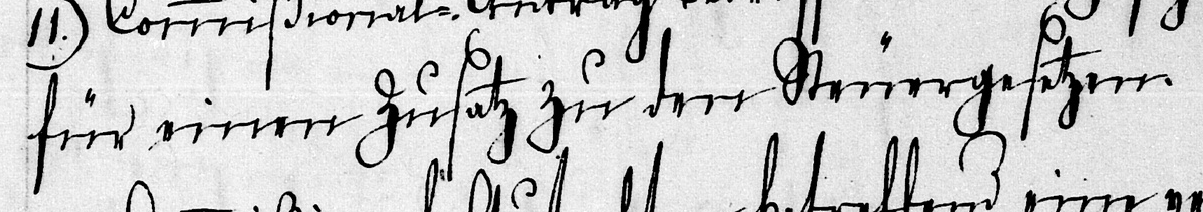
für einen Zusatz zu den Steuergesetzen.
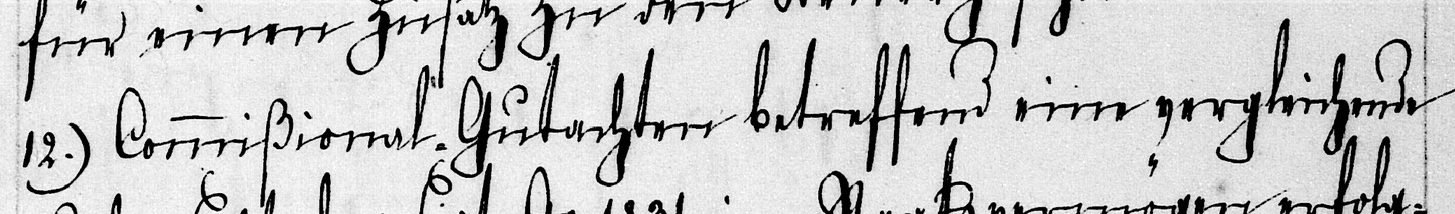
12.) Commißional-Gutachten betreffend eine vergleichende
